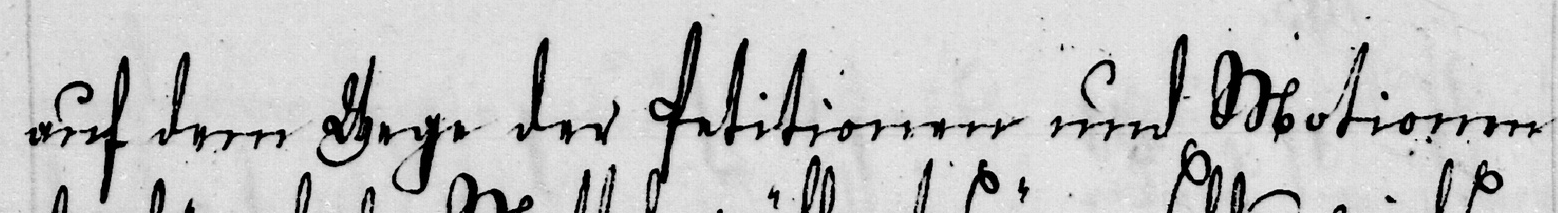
auf dem Wege der Petitionen und Motionen
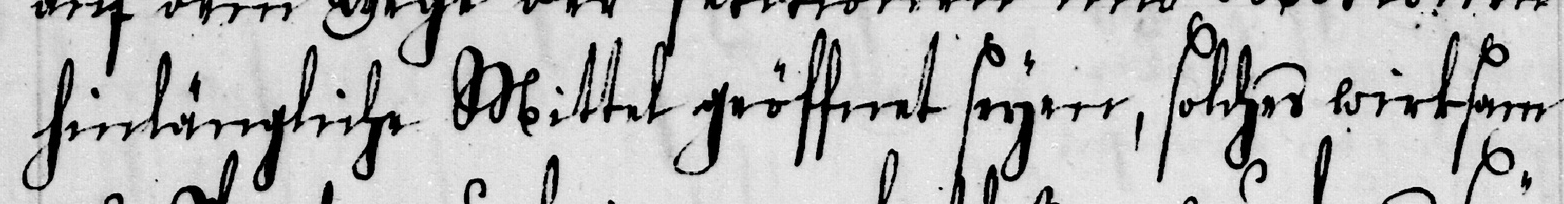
hinlängliche Mittel geöffnet seyen, solches wirksam
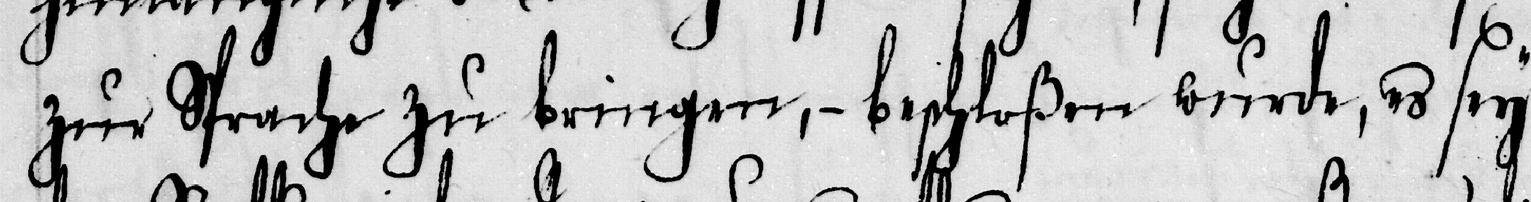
zur Sprache zu bringen, – beschloßen wurde, es sey
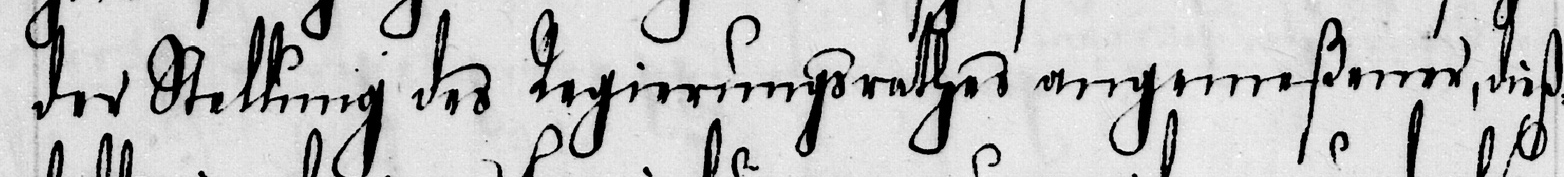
der Stellung des Regierungsrathes angemeßener, die¬
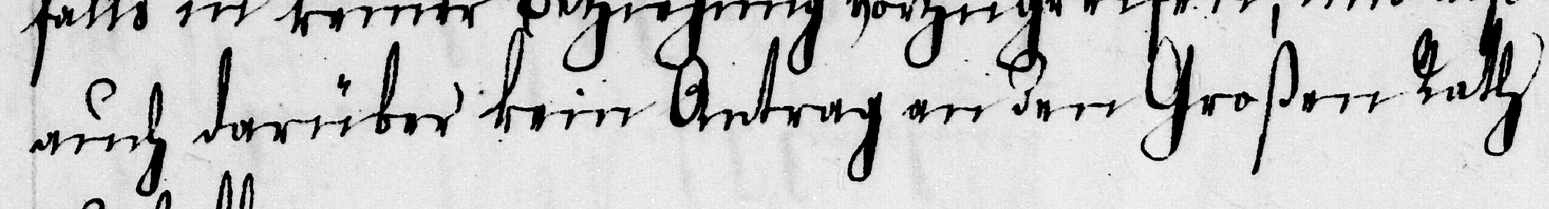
auch darüber kein Antrag an den Großen Rath
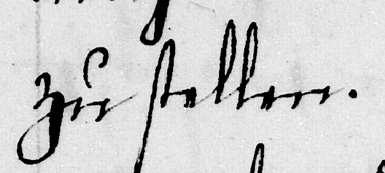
zu stellen.
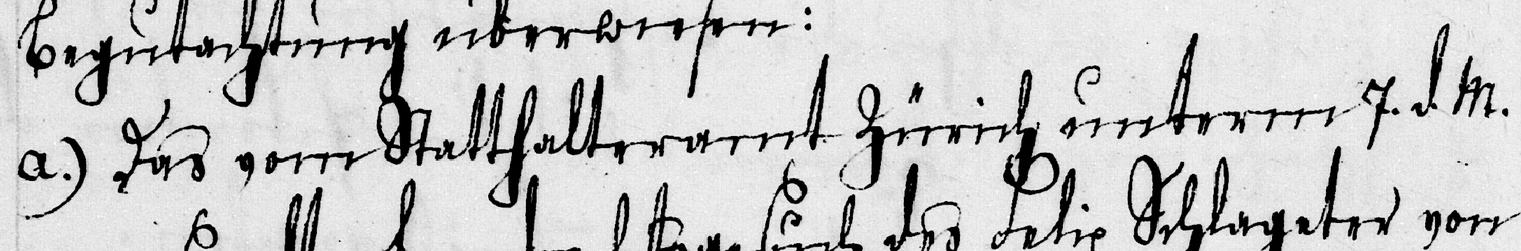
a.) Das vom Statthalteramt Zürich unterm 7. d. M.
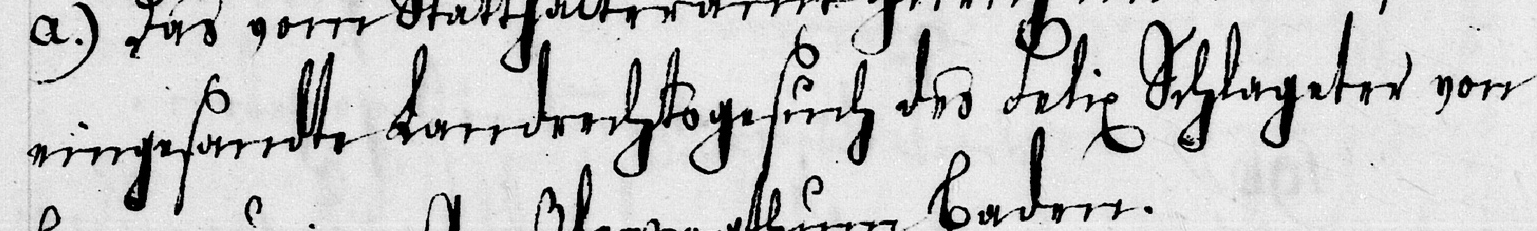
eingesandte Landrechtsgesuch des Felix Schlageter von
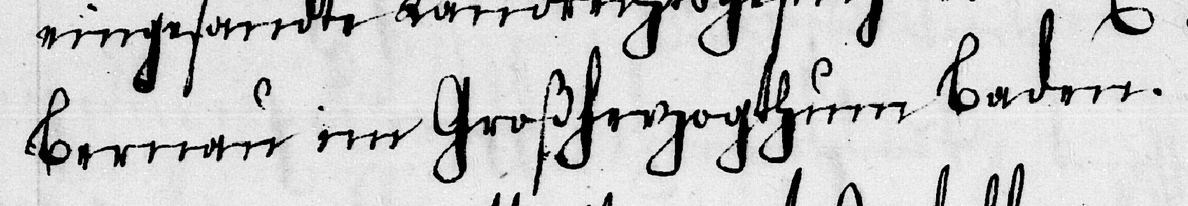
Bernau im Großherzogthum Baden.
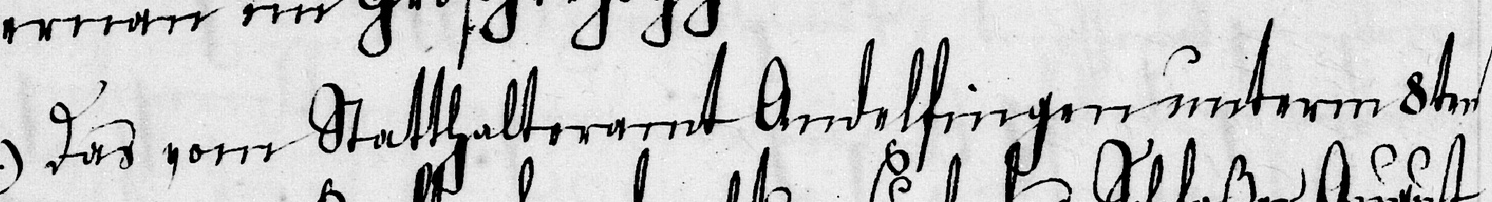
Das vom Statthalteramt Andelfingen unterm 8ten
